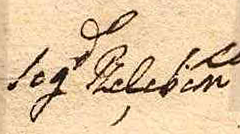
seg.do Reçebin.to
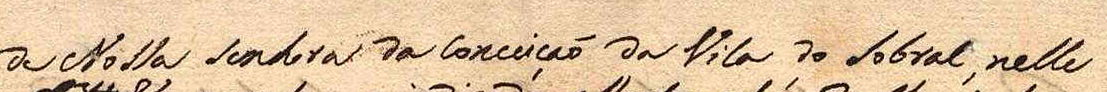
de Nossa senhora da conceiçaõ da Vila do sobral nelle
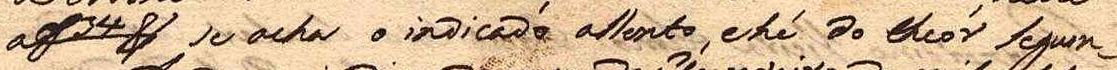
a fo34 se acha o indicado assento, e hé do theor seguin
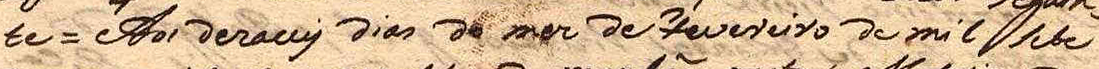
te = Aos dezaceis dias do mez de Fevereiro de mil sete
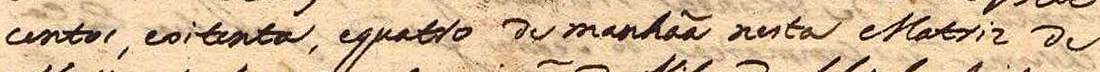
centos, e oitenta, e quatro de manhaã nesta Matriz de
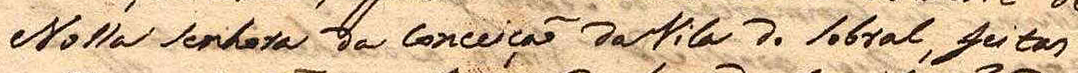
Nossa senhora da conceiçaõ da Vila de sobral, feitas
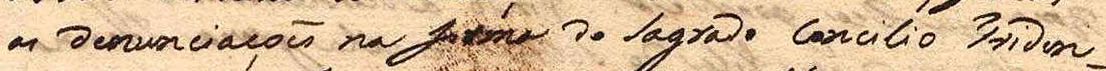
as denunciacoẽs na forma do sagrado concilio Triden
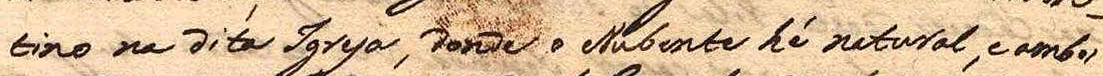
tino na dita Igreja, donde o Nubente hé natural, e ambos
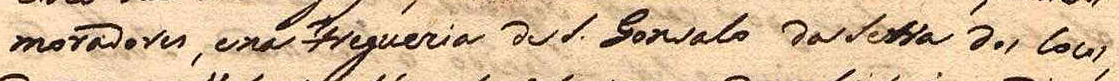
moradores, e na Freguezia de S. Gonsalo da serra dos cocos
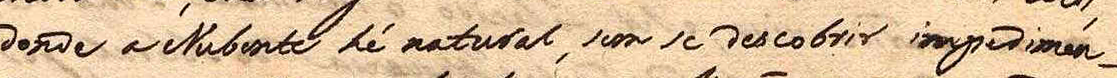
donde a Nubente hé natural sem se descobrir impedimen
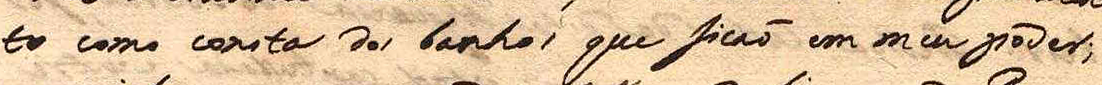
to como consta dos banhos que ficaõ em meu poder;
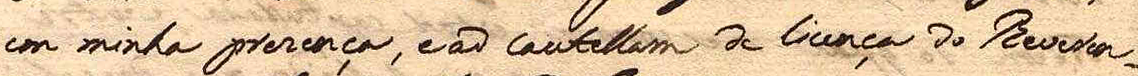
em minha prezença, e ad cautellam de licença do Reveren
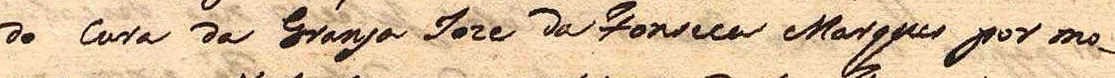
do cura da Granja Ioze da Fonseca Marques por mo
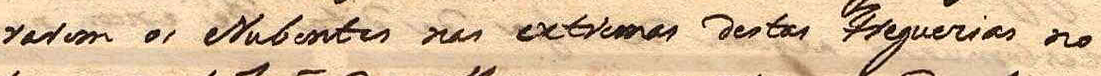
rarem os Nubentes nas extremas destas Freguezias no
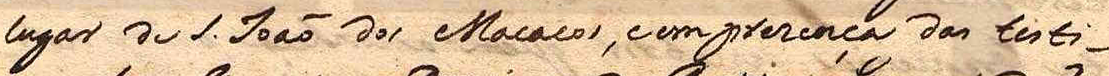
lugar de S. Ioão dos Macacos, e em prezença das testi
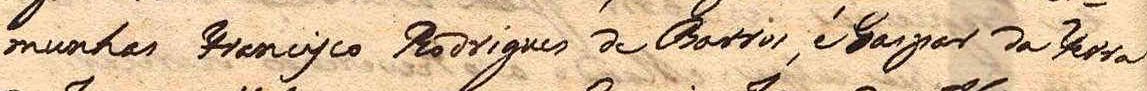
munhas Francisco Rodrigues de Barros, e Gaspar da Terra
